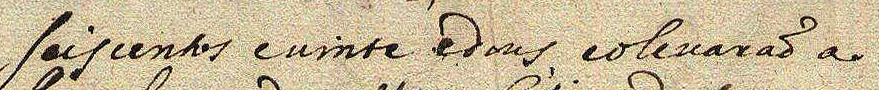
seiscentos e uinte e dous e o leuaraõ a
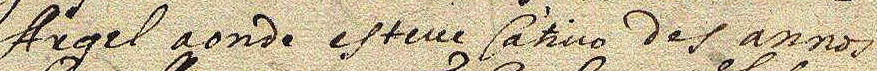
Argel aonde esteue Catiuo des annos
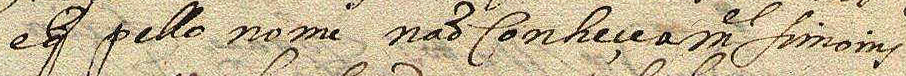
e q̄ pello nome naõ Conhece a mel simoins
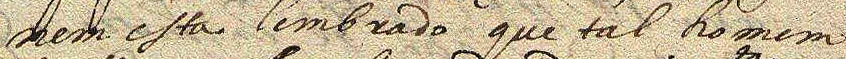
nem esta lembrado que tal homem
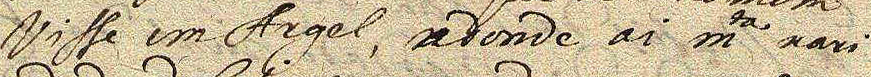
Visse em Argel, adonde ai mta uari
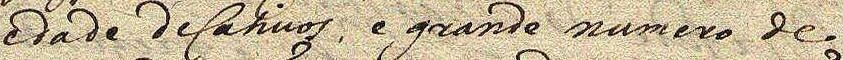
edade de Catiuos, e grande numero de
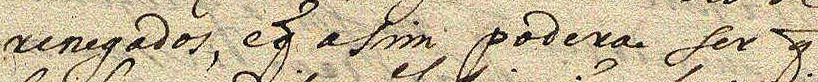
renegados, e q̄ asim podera ser q̄
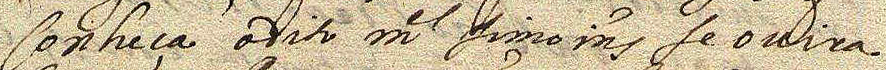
Conheça o dito mel simoin̄s se o uira
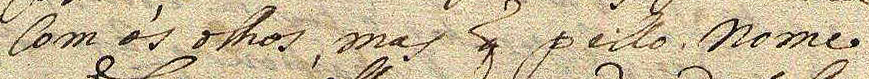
com os olhos, mas q̄ pello nome
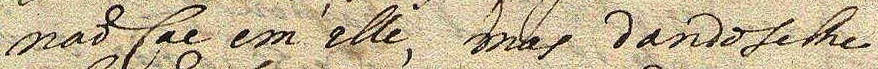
naõ Cae em elle, mas dandoselhe
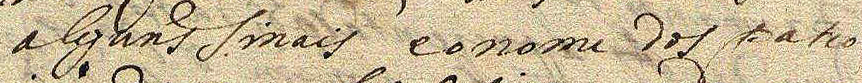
algun̄s sinais e o nome dos patro
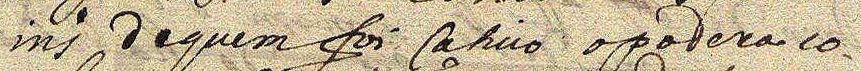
ins de quem foi Catiuo o podera co
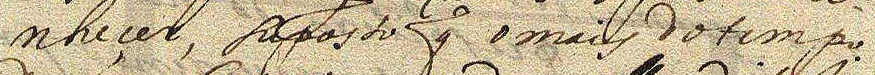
nhecer, suposto q̄ o mais do tempo
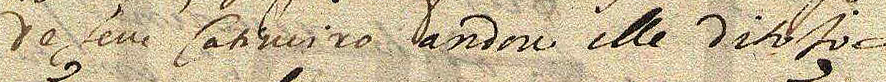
de seu Catiueiro andou elle dito Jo
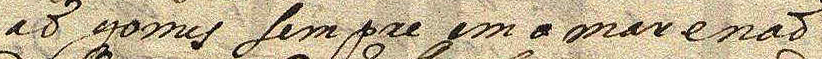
aõ gomes sempre em o mar e naõ
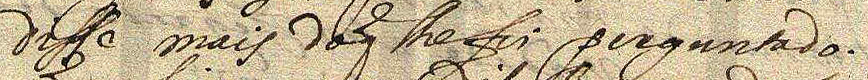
disse mais do q̄ lhe foi perguntado.
